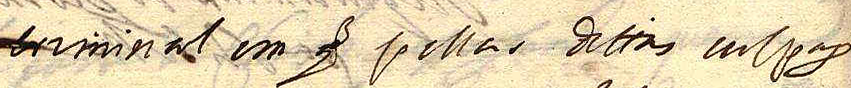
criminal em q̄ pellas dittas culpas
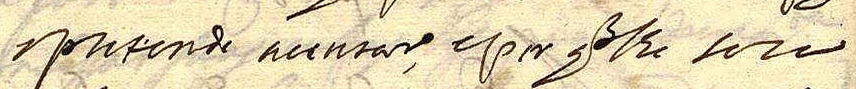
o pretende acentar, e porq̄ lhe sera
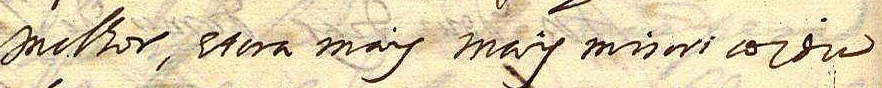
melhor, E tera mais mais misericordia
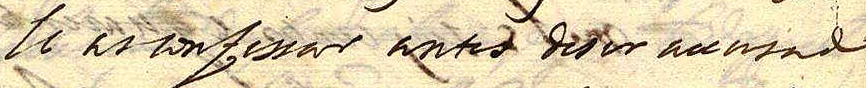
se as confessar antes de ser accusado
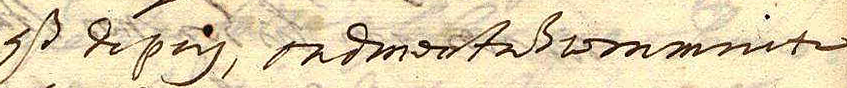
q̄ depois, o admoestaõ com muita
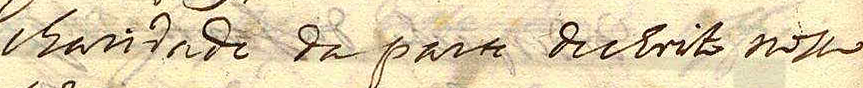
charidade da parte de christo nosso
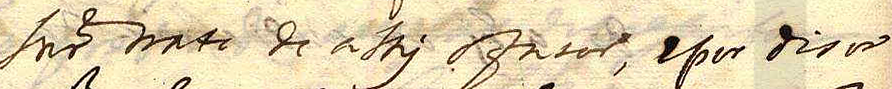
snr̄ trate de assy o fazer, e por diser
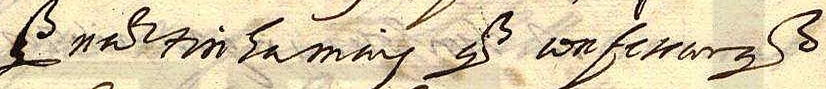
q̄ naõ tinha mais q̄ confessar q̄
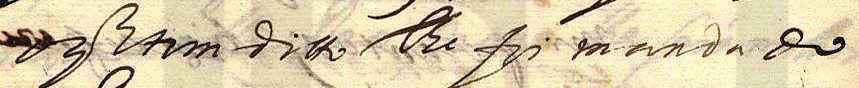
o q̄ tem ditto lhe foi mandado
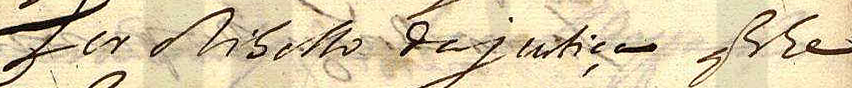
Ler o libello da justiça q̄ he
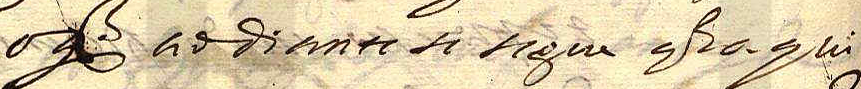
o q̄ ao diante se segue q̄ aqui
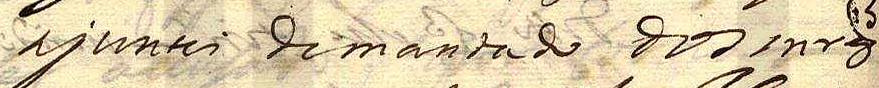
ajuntei de mandado dos snres̄
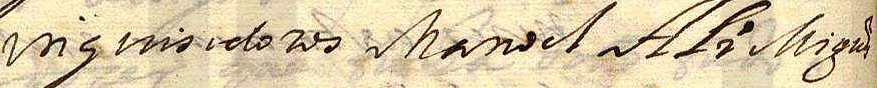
inquisidores Manoel ALz̄ Migū_
